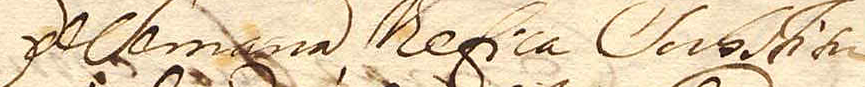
de Semana, lhe fica substitu
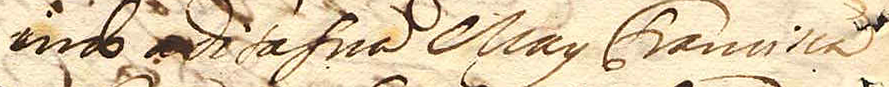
indo a dita sua May Francisca
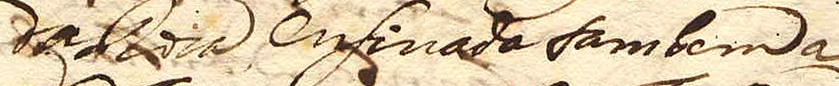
da Roza ensinada tambem a
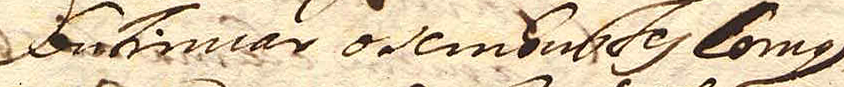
Continuar os embustes Com q̄
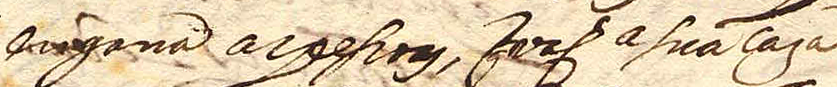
engana as pessoas, q̄ vaõ a sua caza
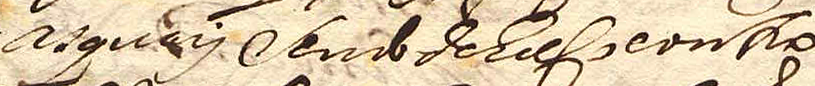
as quais Sendo de hū e outro
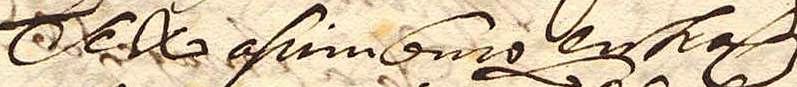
Sexo assim Como entraõ
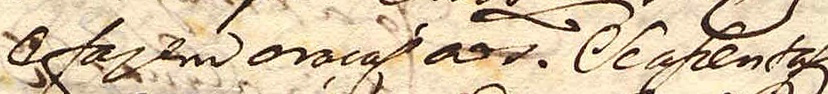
e fazem oraçaõ ao s.to Se assentaõ
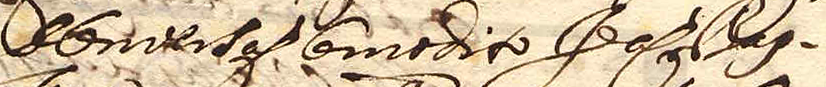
e Conversaõ Com o dito Joaõ Bap
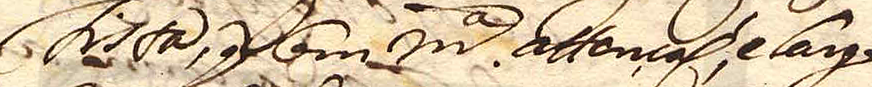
tista, q̄ Com m.ta attençaõ, e largo
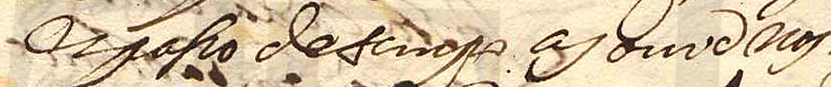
espasso de tempo as ouve nos
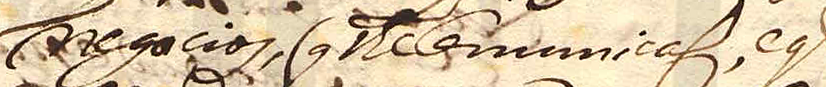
negocios, q̄ lhe Comunicaõ, e q̄
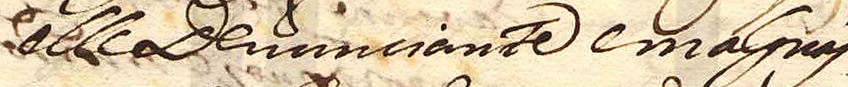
ella Denunciante em alguās
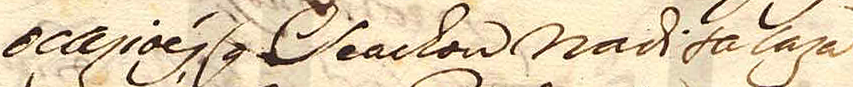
ocazioēs, q̄ se achou na dita caza
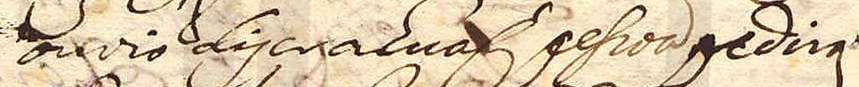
ouvio dizer a huā pessoa pedira
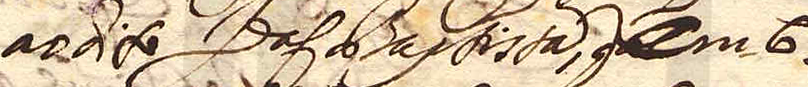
ao dito Joaõ Baptista, q̄ Emco
